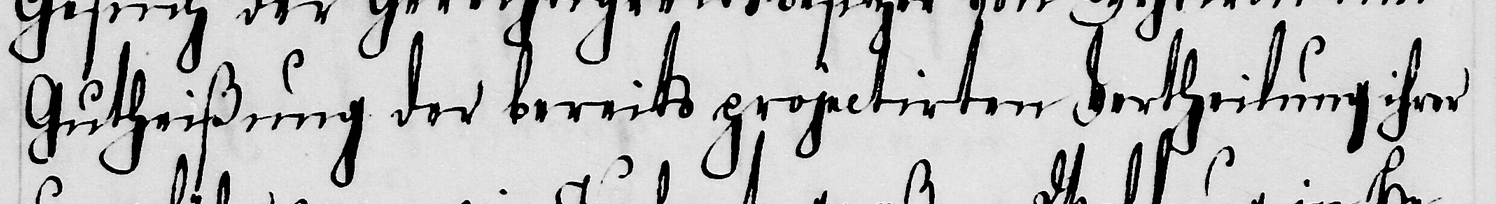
Gutheißung der bereits projectirten Vertheilung ihrer
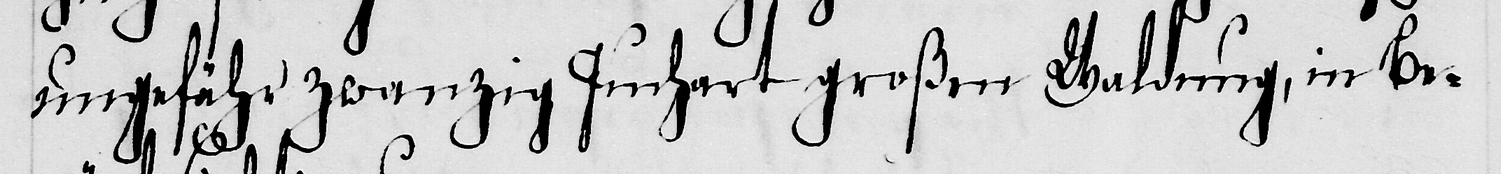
ungefähr zwanzig Juchart großen Waldung, in Be¬
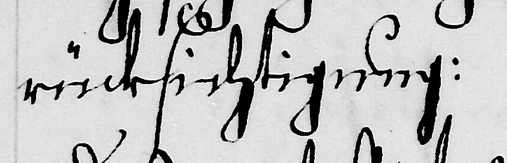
rücksichtigung:
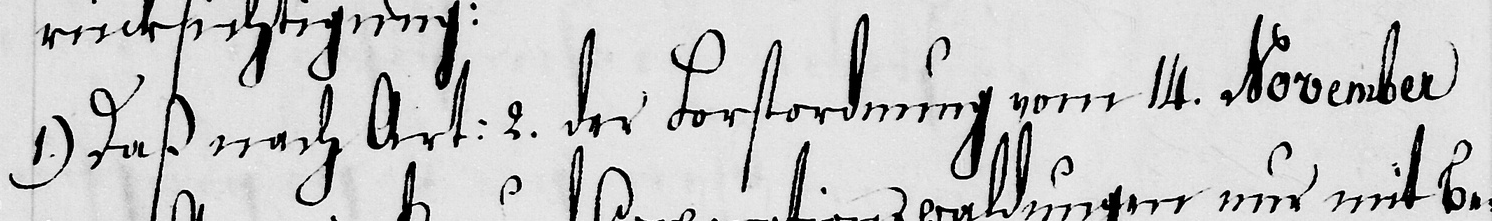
1.) Daß nach Art: 2. der Forstordnung vom 14. November
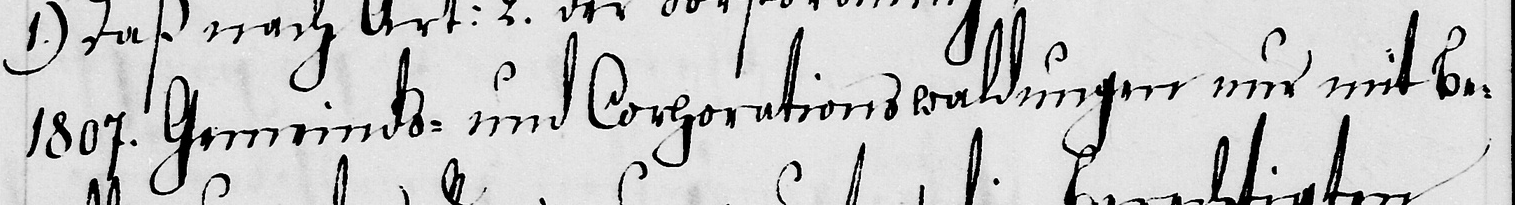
1807. Gemeinds- und Corporationswaldungen nur mit Be¬
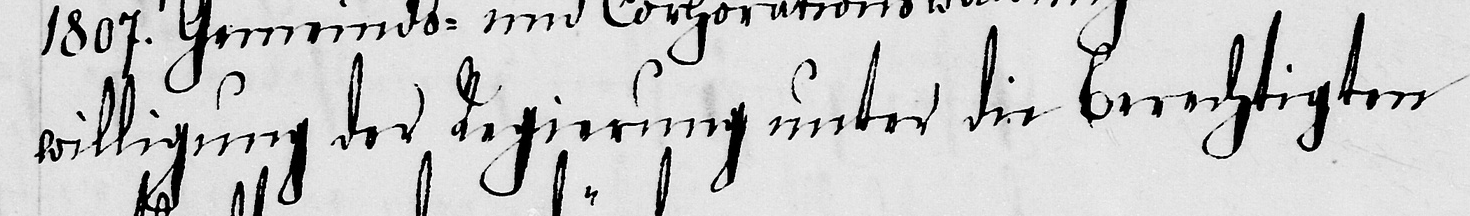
willigung der Regierung unter Berechtigten
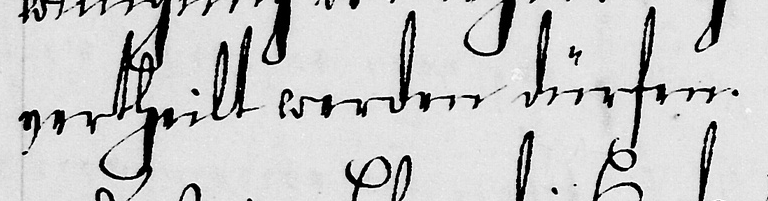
vertheilt werden dürfen.
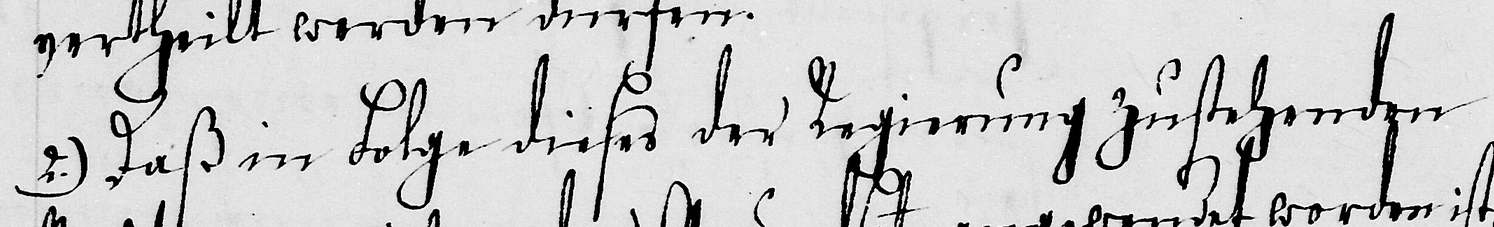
2.) Daß in Folge dieses der Regierung zustehenden
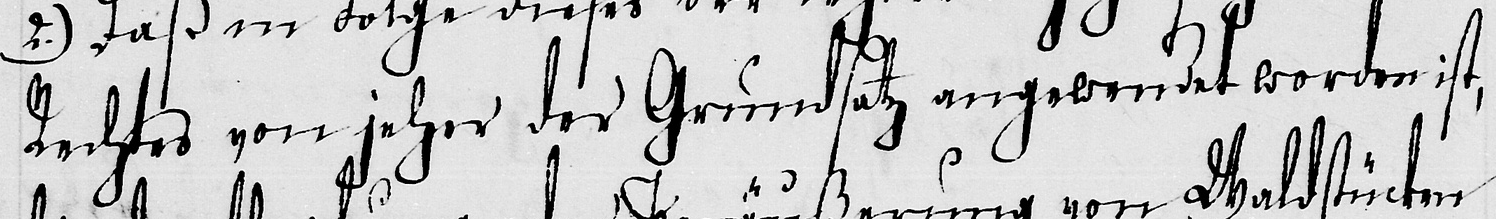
Rechtes von jeher der Grundsatz angewendet worden ist,
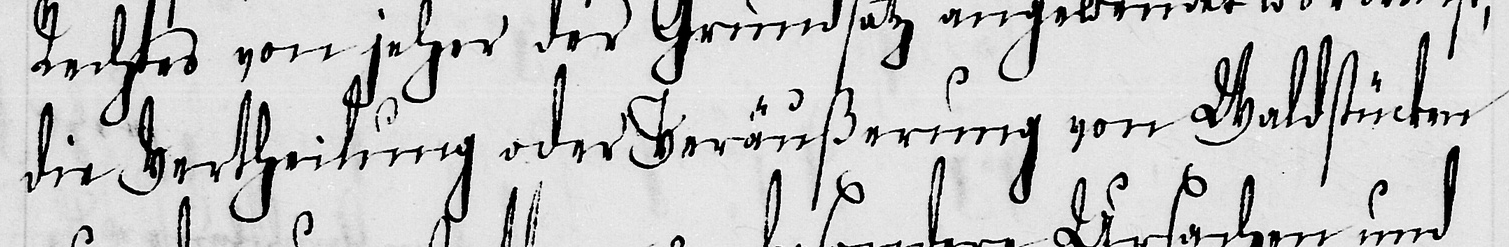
die Vertheilung oder Veräußerung von Waldstücken
